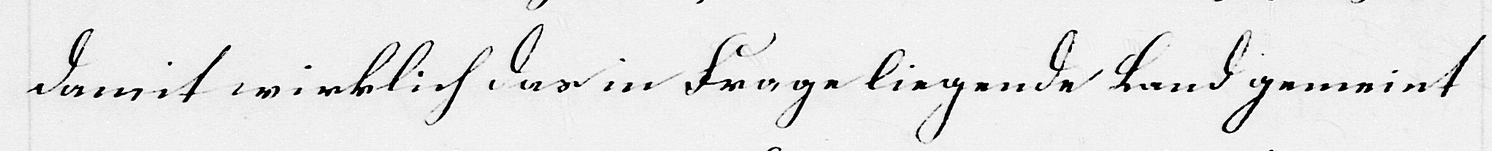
damit wirklich das in Frage liegende Land gemeint
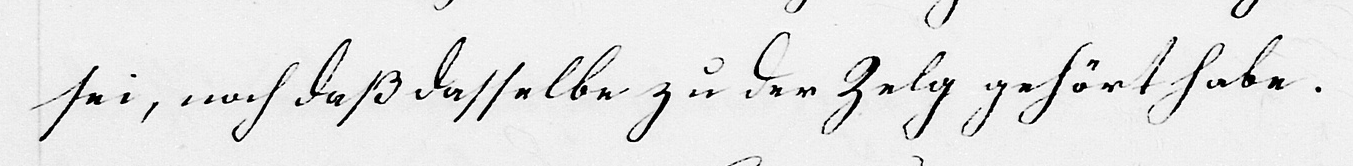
sei, noch daß dasselbe zu der Zelg gehört habe.
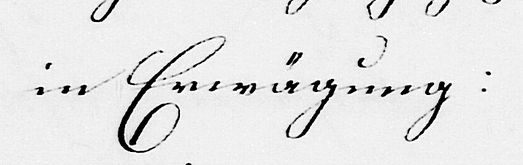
in Erwägung:
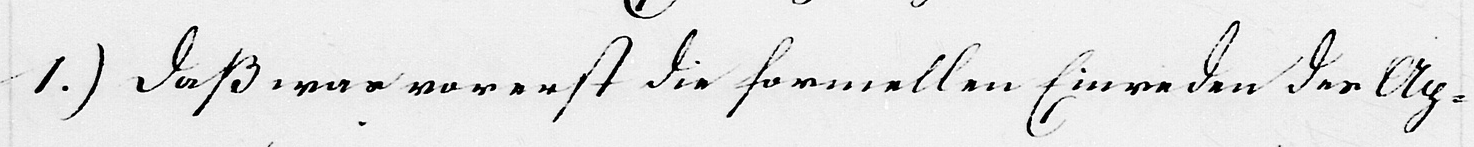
1.) Daß was vorerst die formellen Einreden des Ap¬
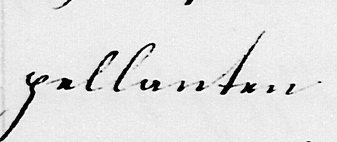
pellanten
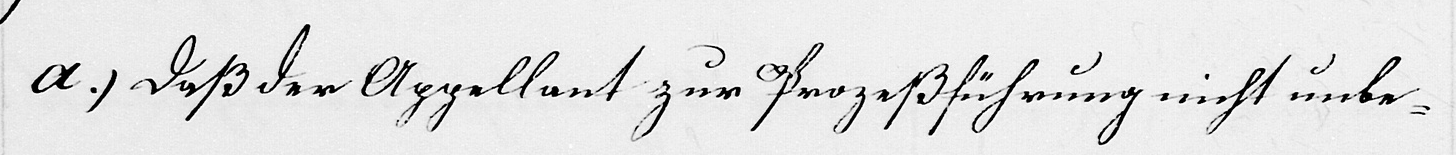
a.) Daß der Appellant zur Prozeßführung nicht unbe¬
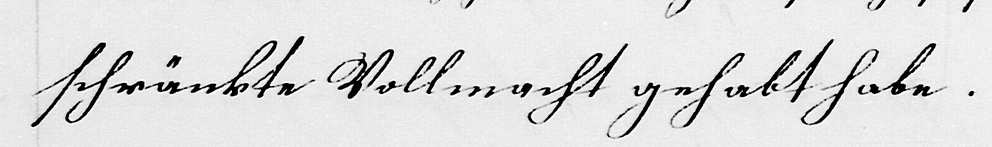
schränkte Vollmacht gehabt habe.
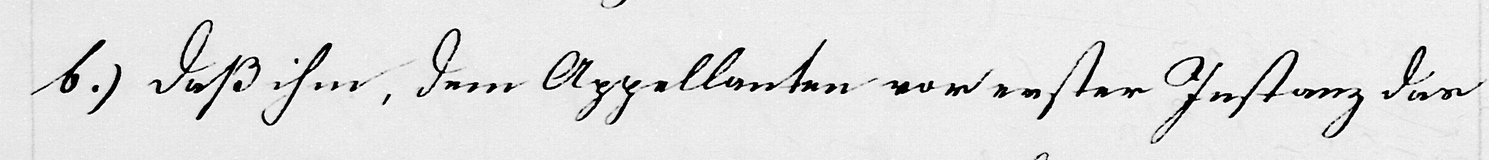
b.) Daß ihm, dem Appellanten vor erster Instanz das
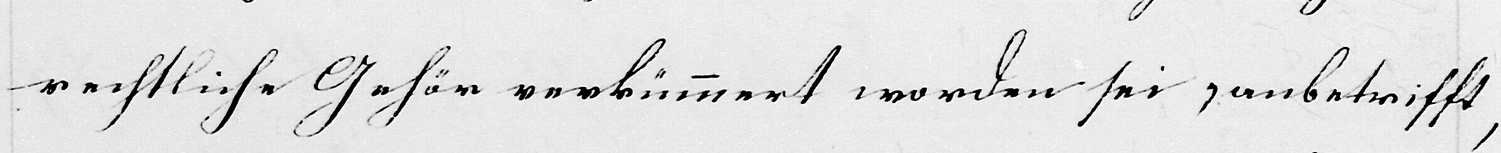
rechtliche Gehör verkümmert worden sei, anbetrifft,
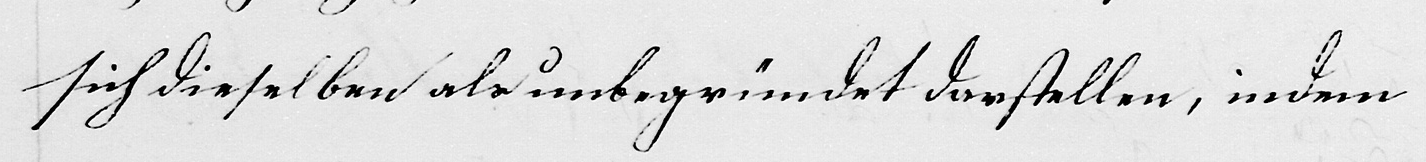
sich dieselben als unbegründet darstellen, indem
